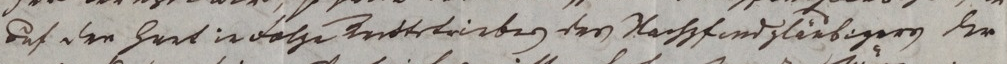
auf der Gant in Folge Rechtstriebes des Nachpfandgläubigers der
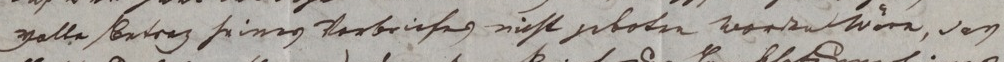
volle Betrag seines Vorbriefes nicht geboten worden wäre, das
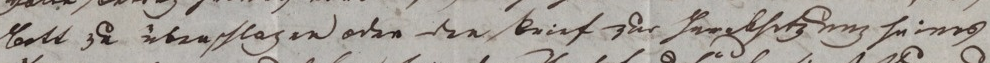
Bott zu überschlagen oder den Brief zur Herabsetzung seines
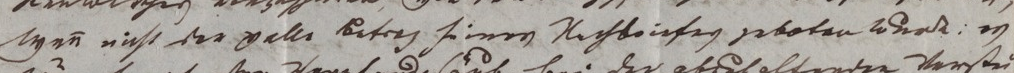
wenn nicht der volle Betrag seines Nachbriefes geboten wurde; es
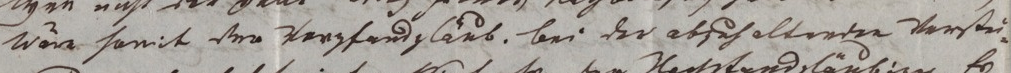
wäre somit der Vorpfandgläub. bei der abzuhaltenden Verstei-
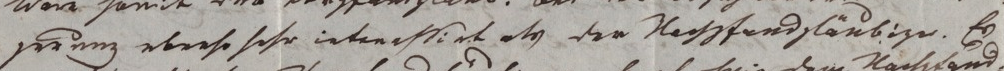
gerung ebenso sehr interessirt als der Nachpfangläubiger. Es
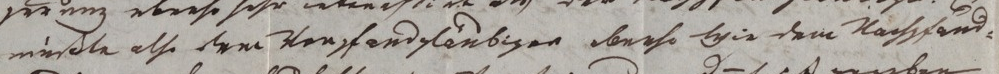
müßte also dem Vorpfangläubiger ebenso wie dem Nachpfand-
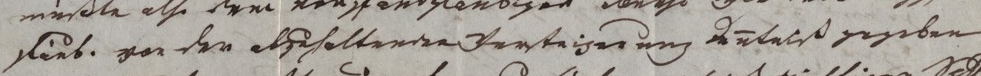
gläub. von der abzuhaltenden Versteigerung Kenntniß gegeben
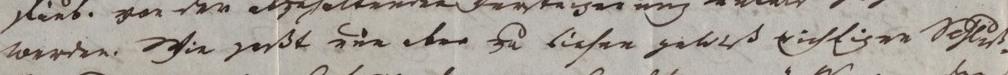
werden. Wie paßt nun aber zu diesen gewiß richtigen Schluß-
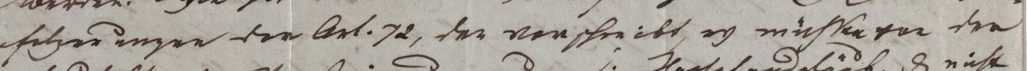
folgerungen der Art. 72, der vorschreibt, es müssen von der
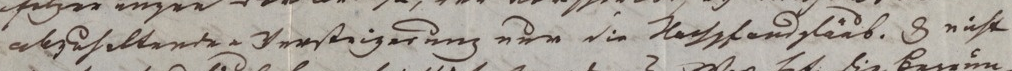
abzuhaltenden Versteigerung nur die Nachpfandgläub. & nicht
